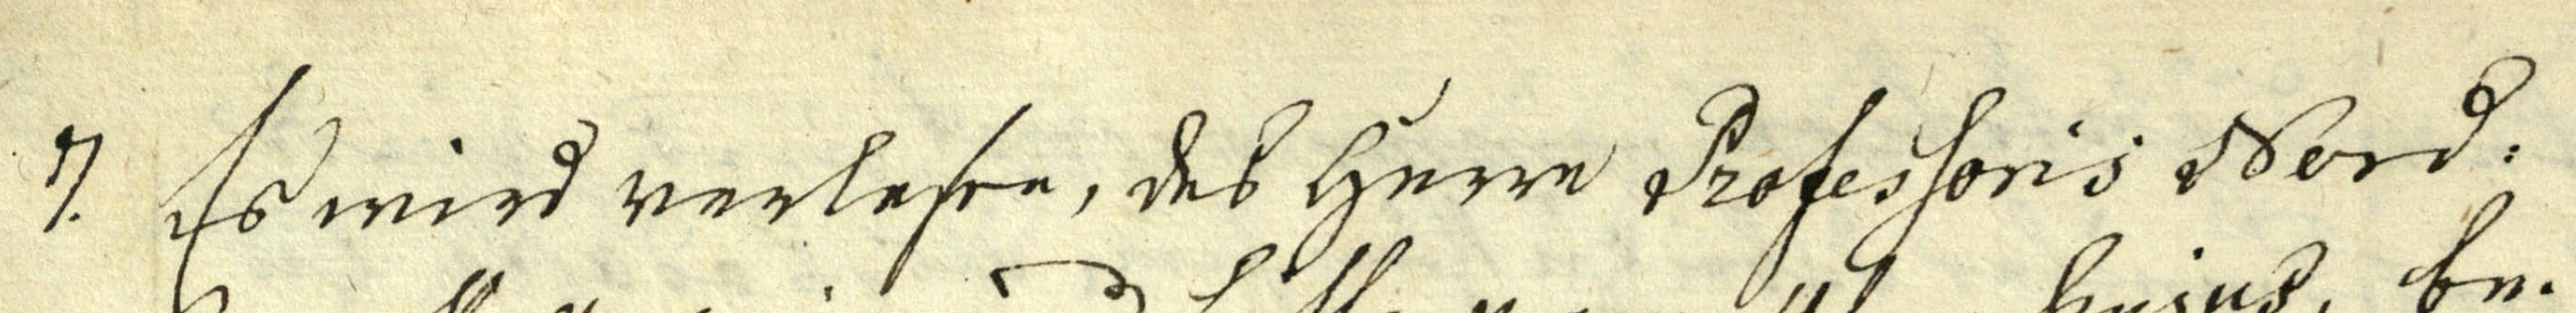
7. Es wird verlesen, des Herrn Professoris Nord¬
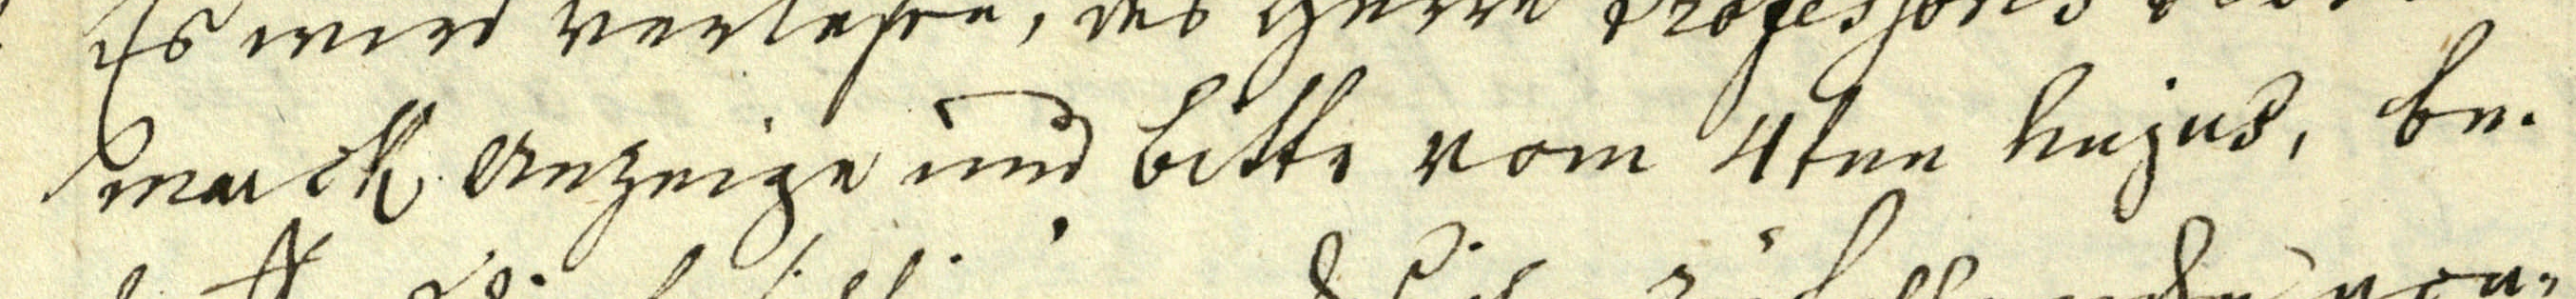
marck Anzeige und Bitte vom 4ten hujus, be¬
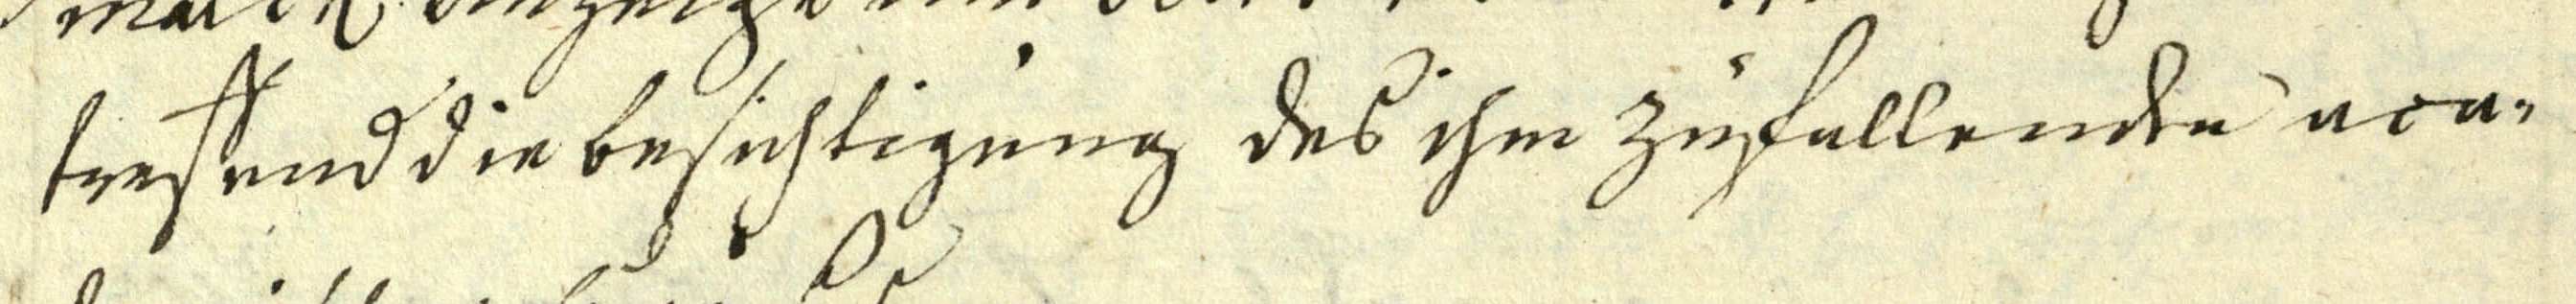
treffend die Besichtigung des ihm zufallenden aca¬
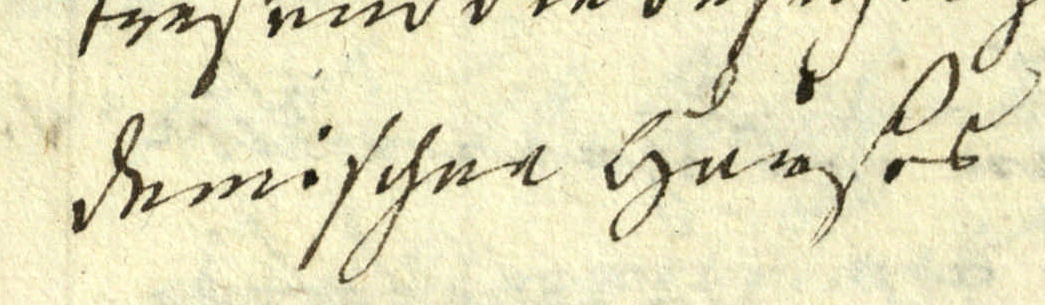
demischen Haußes.
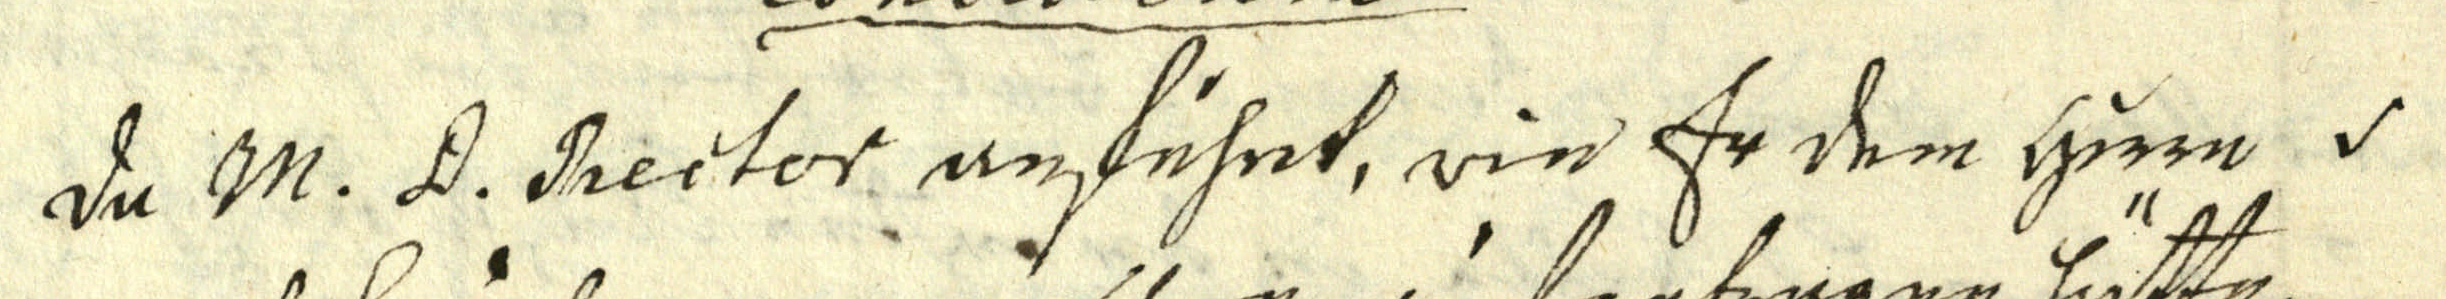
Da M. D. Rector anführet, wie Er dem Herrn
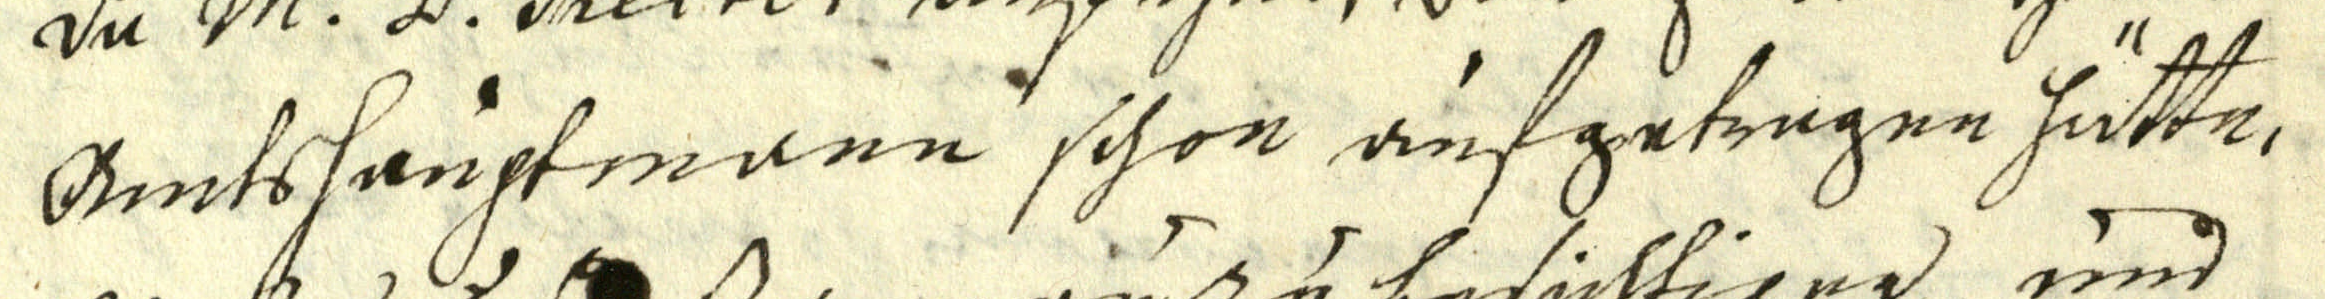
Amtshauptmann schon aufgetragen hätte,
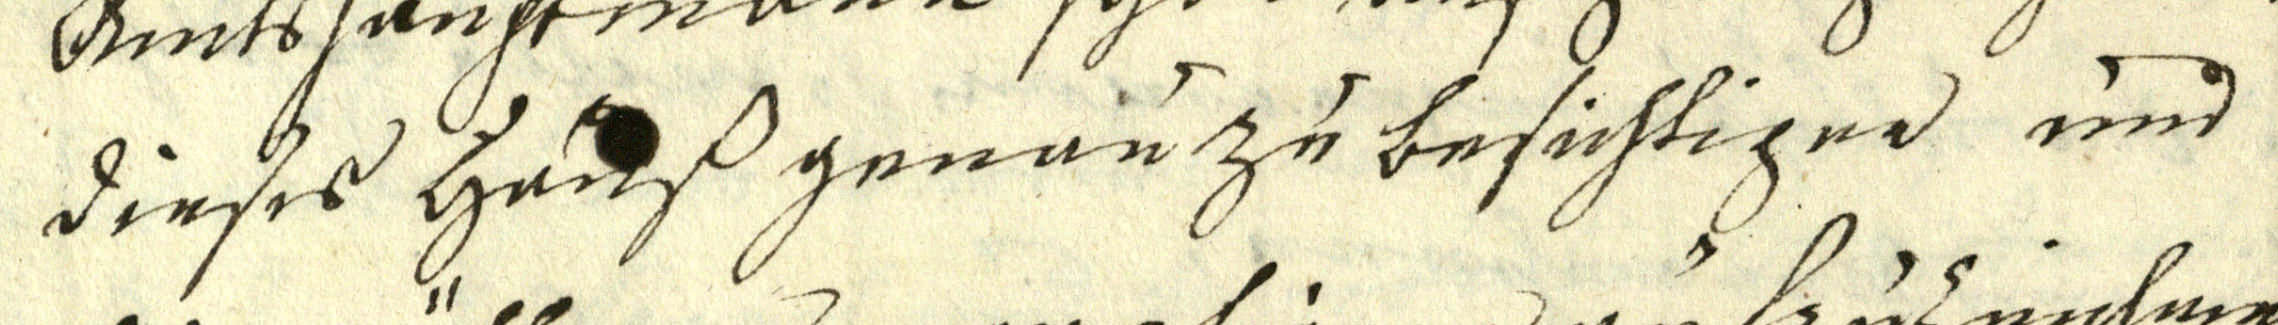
dieses Haus genau zu besichtigen und
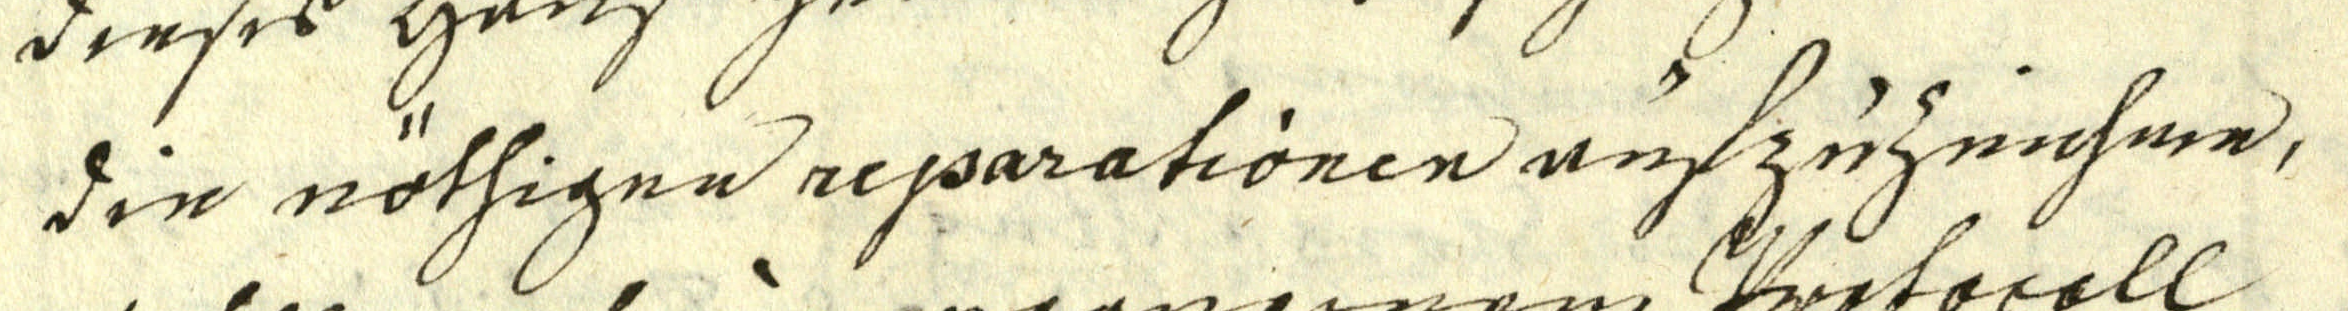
die nöthigen reparationen aufzuzeichnen,
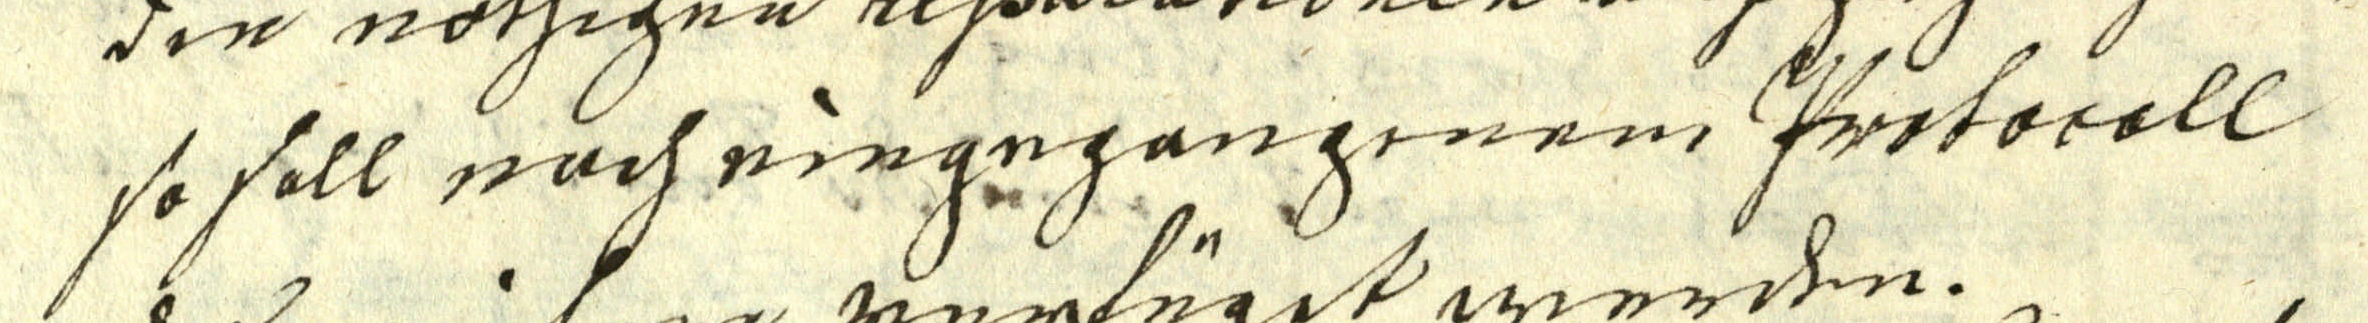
so soll nach eingegangenem Protocoll
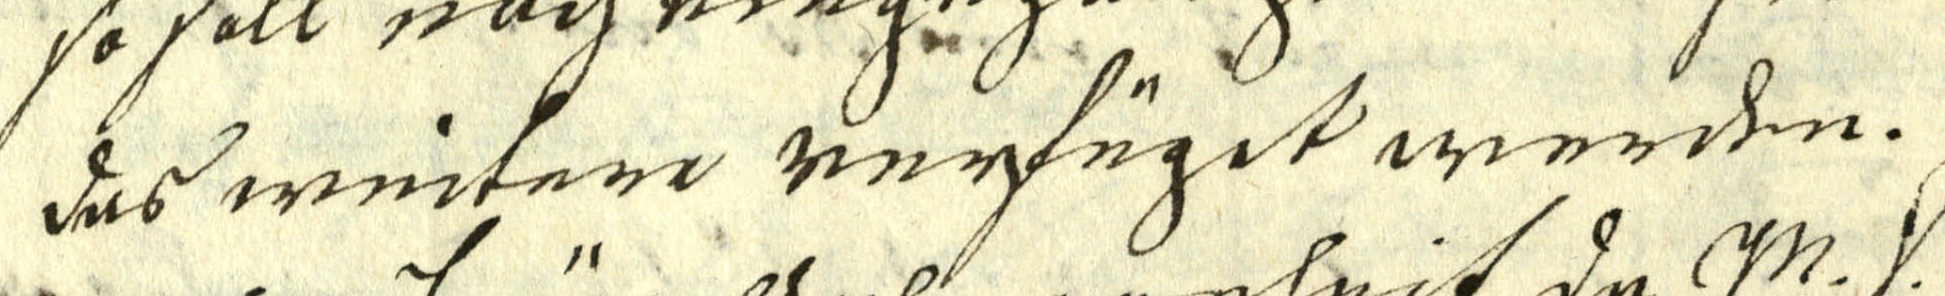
das weitere verfüget werden.
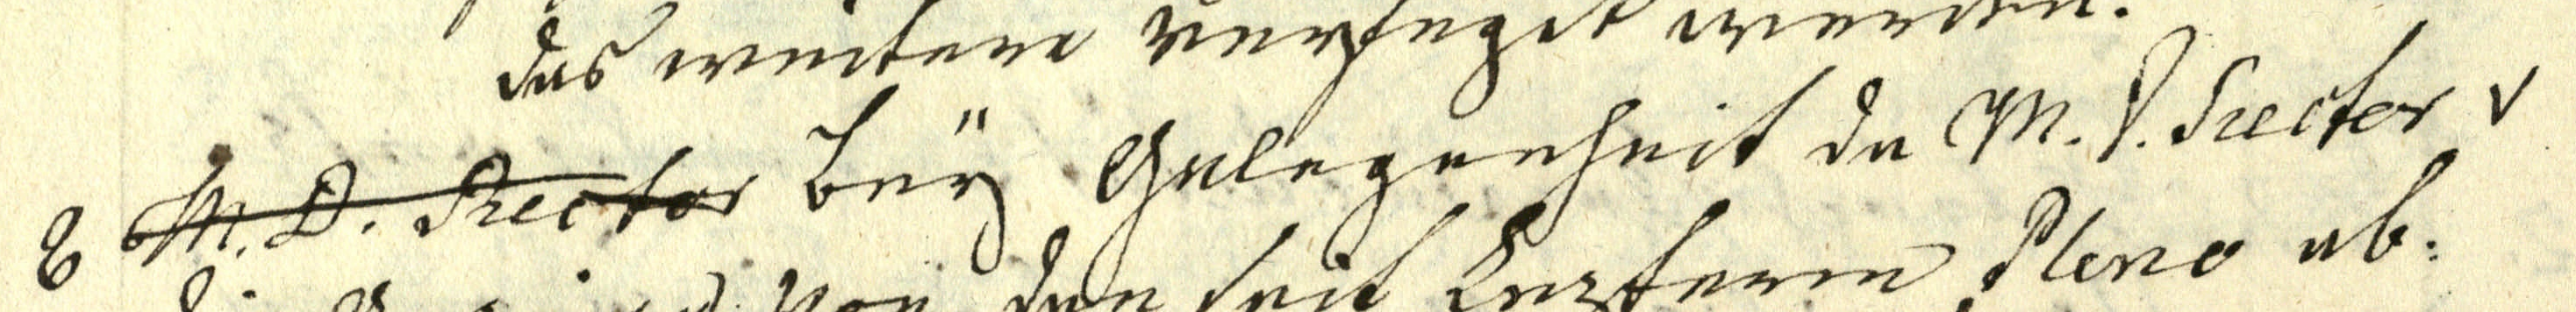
8. M. D. Rector Beÿ Gelegenheit da M. D. Rector
